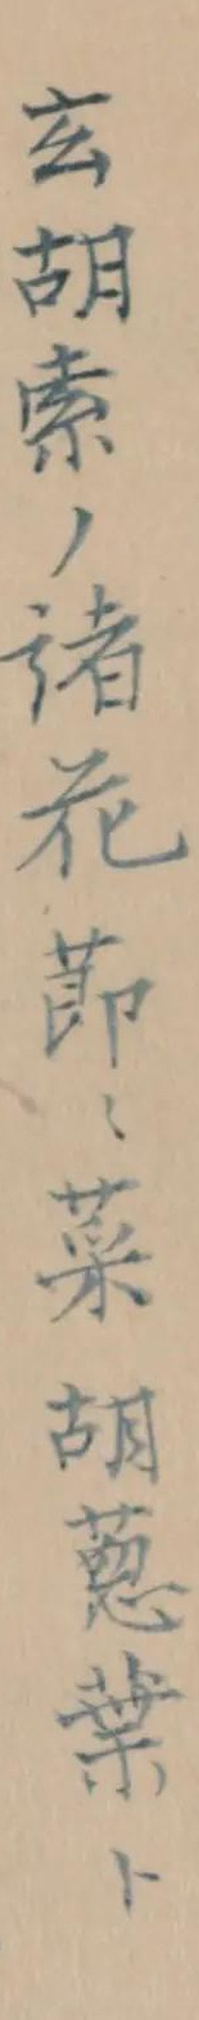玄胡索ノ諸花莭々菜胡葱葉ト
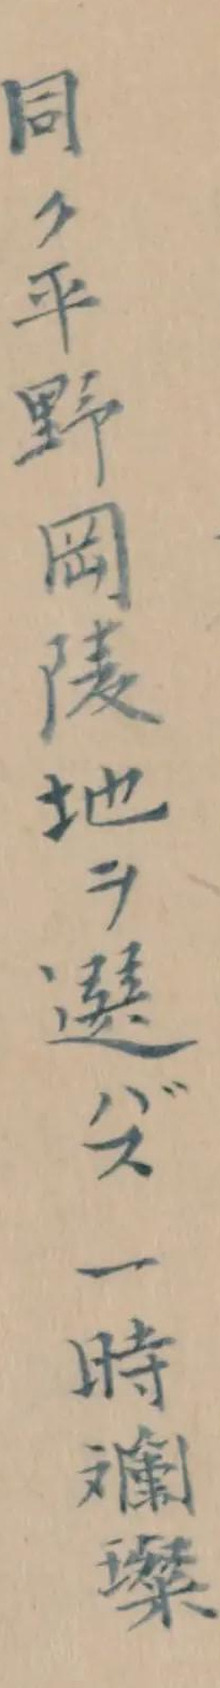同ク平野岡陵地ヲ選バズ一時斕璨
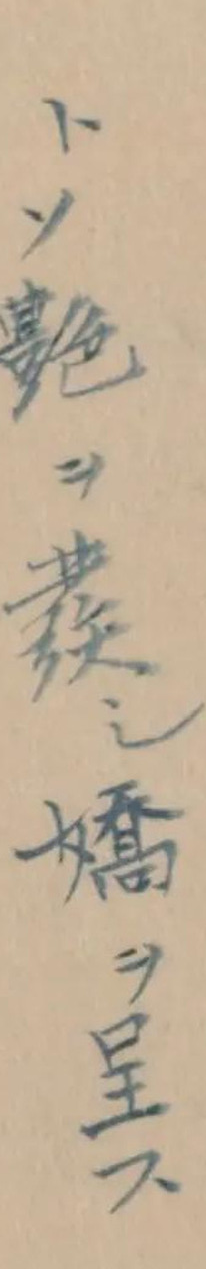トシテ艶ヲ発シ嬌ヲ呈ス
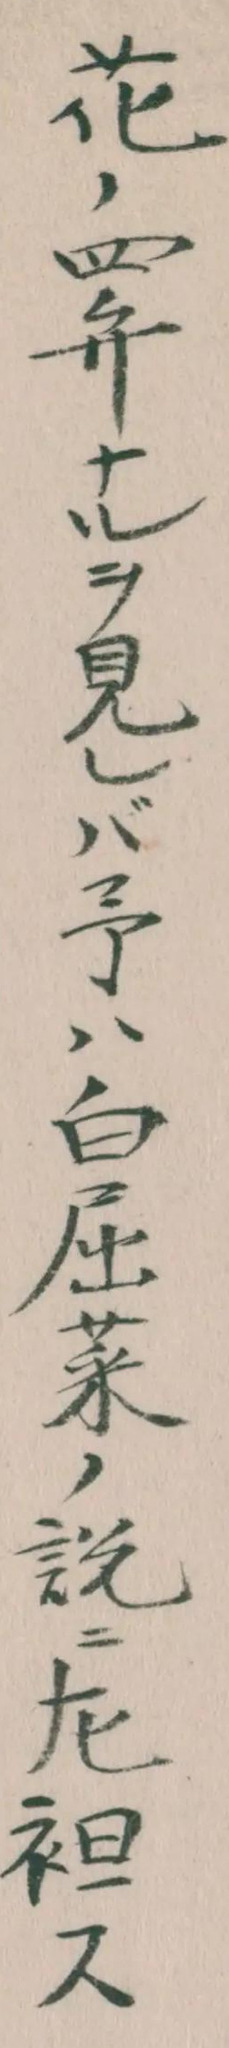花ノ四弁ナルヲ見レバ予ハ白屈菜ノ節ニ左袒ス

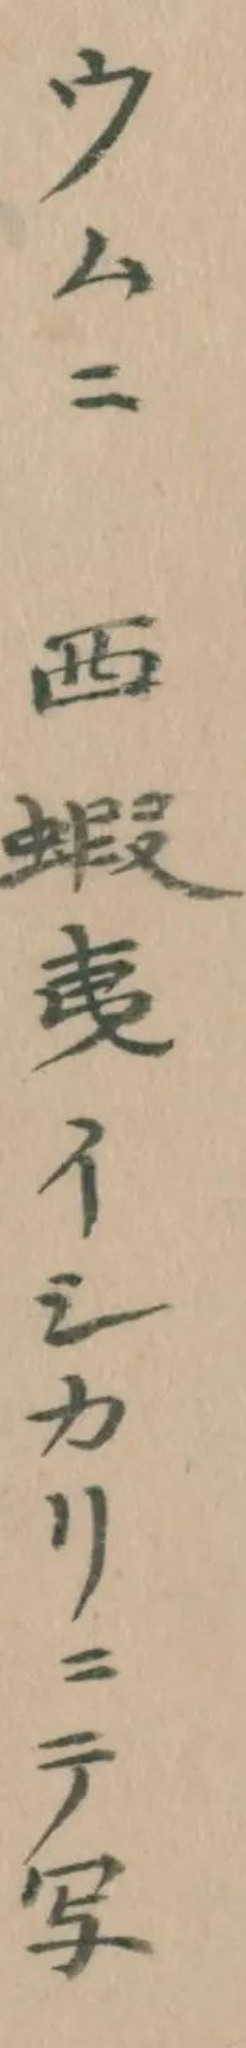ウムニ西蝦夷イシカリニテ写
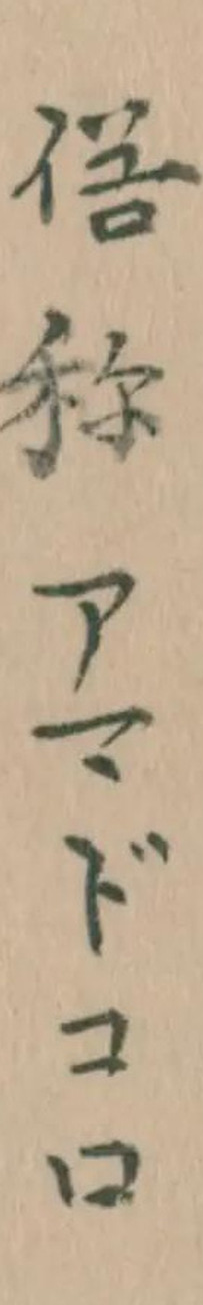俗称アマドコロ
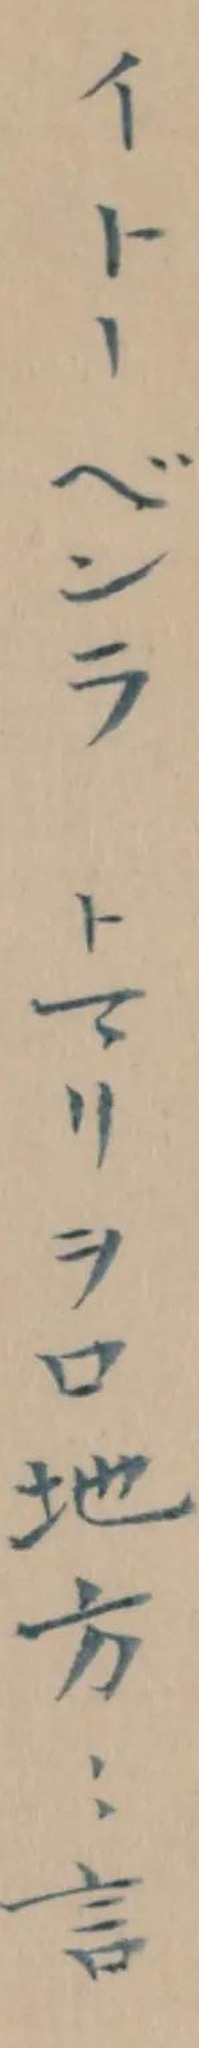イトーベンラトマリヲロ地方ニ言
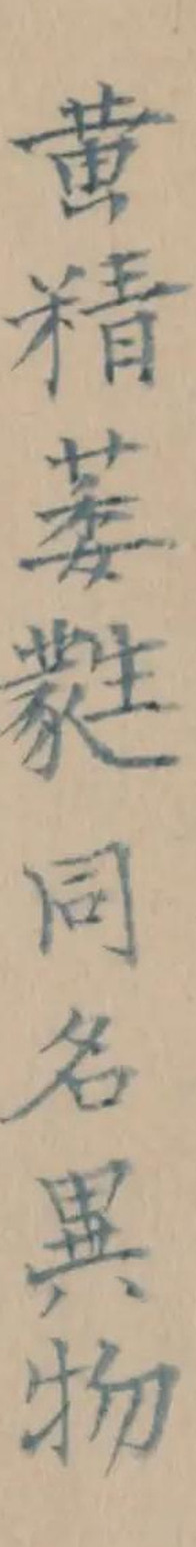黄精萎㽔同名異物

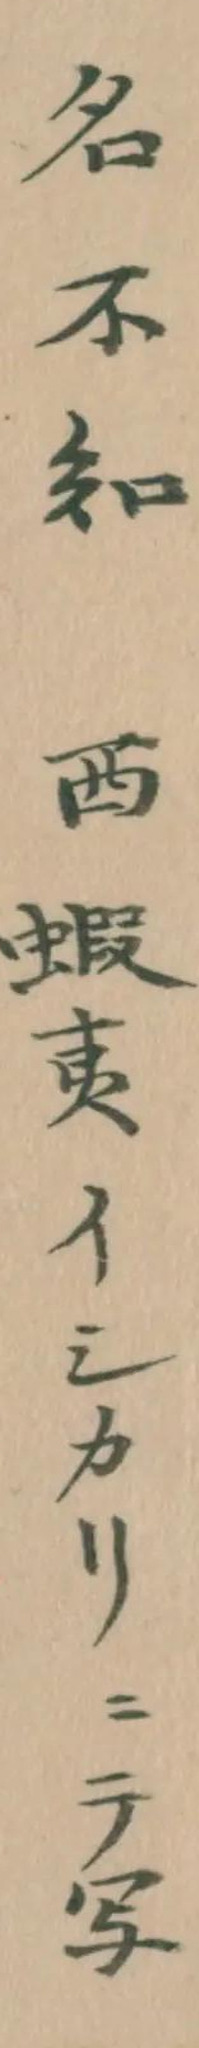名不知西蝦夷イシカリニテ写
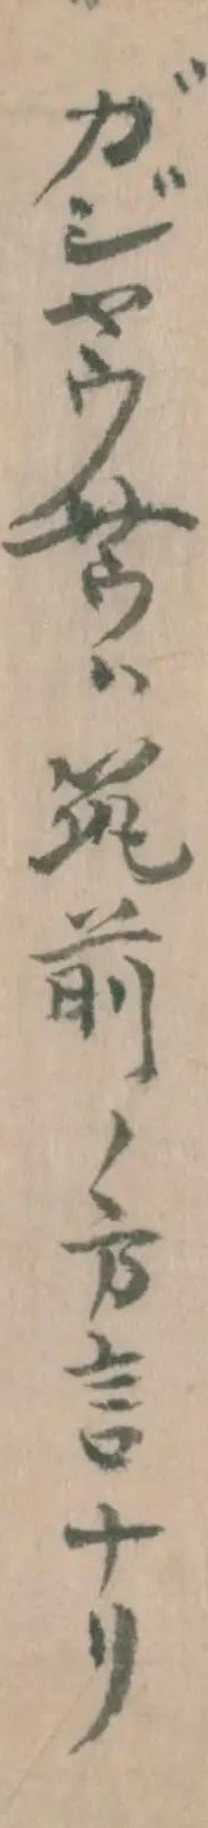ガジヤウサウハ筑前ノ方言ナリ
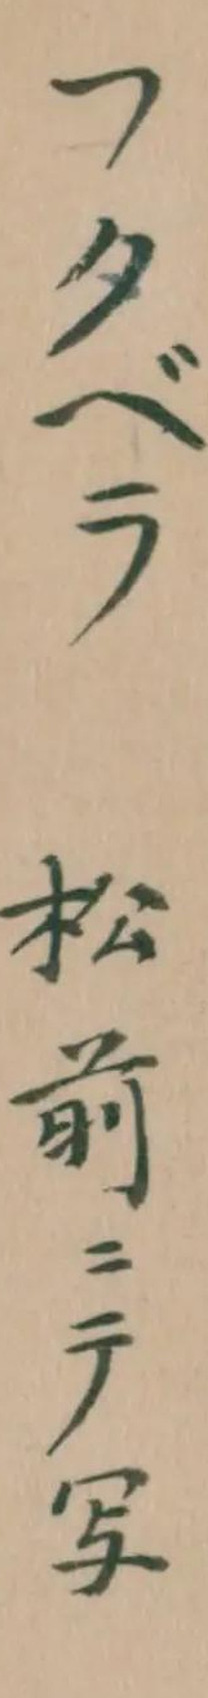フタベラ松前ニテ写

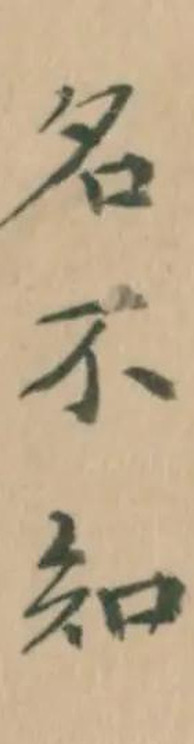名不知
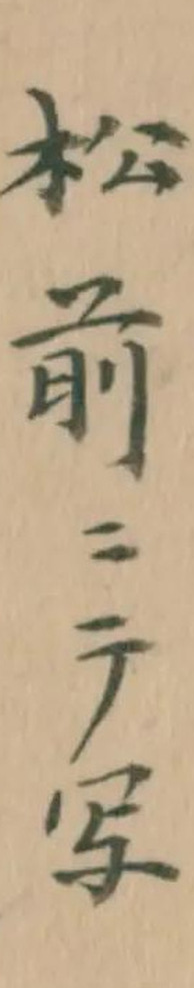松前ニテ写
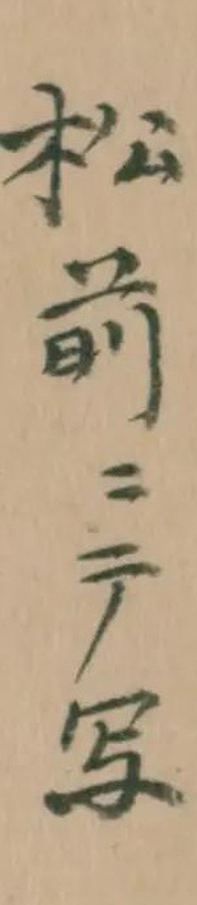松前ニテ写
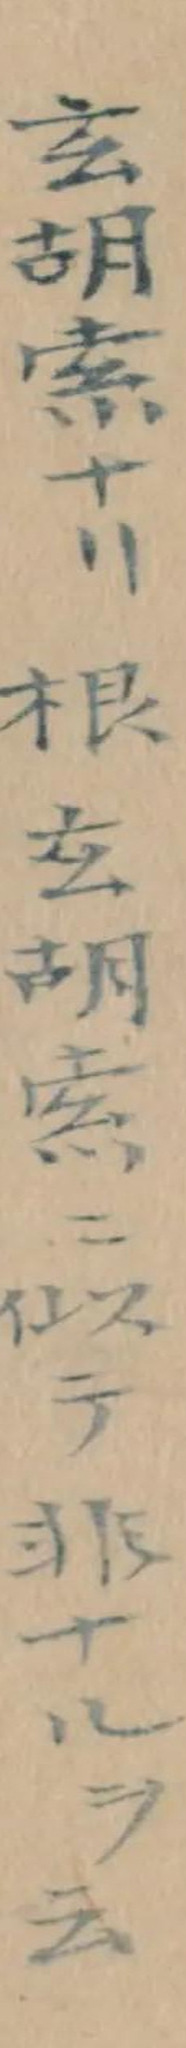玄胡索ナリ根玄胡索ニ似テ非ナルヲ云
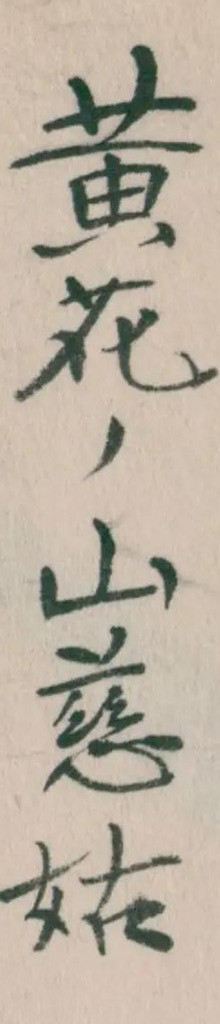黄花ノ山慈姑
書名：蝦夷草木図
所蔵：国立国会図書館 National Diet Library, JAPAN
